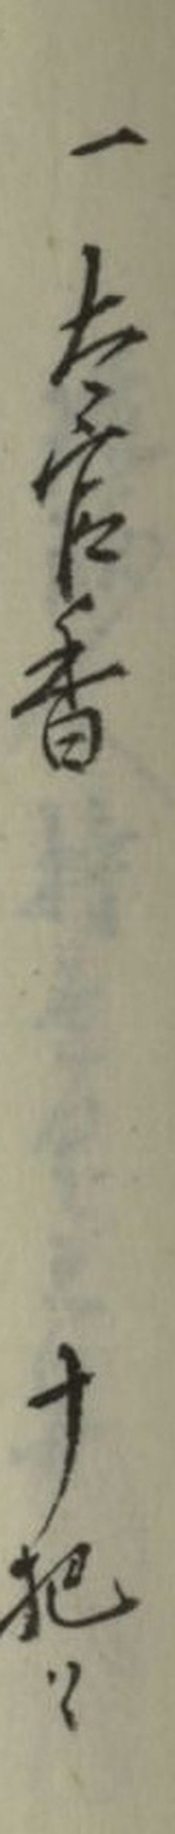一太官香十把ツヽ
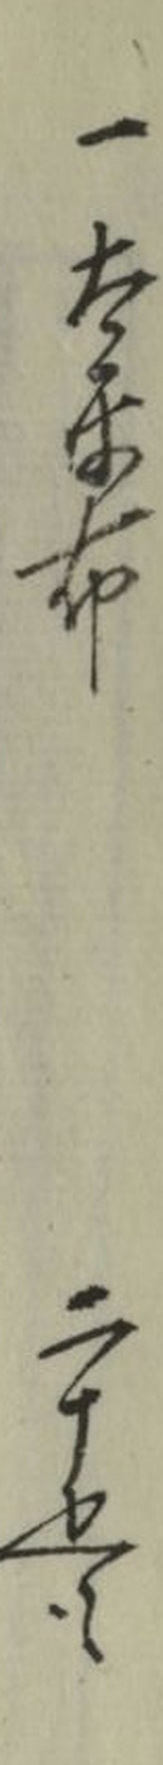一太平布二十疋ツヽ
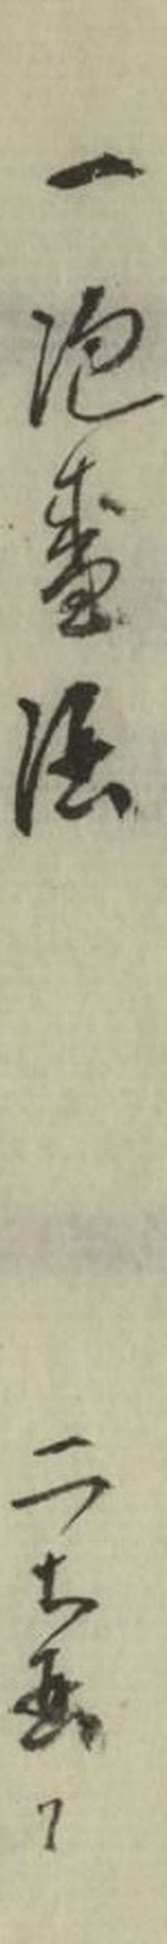一泡盛酒二十壺ツヽ
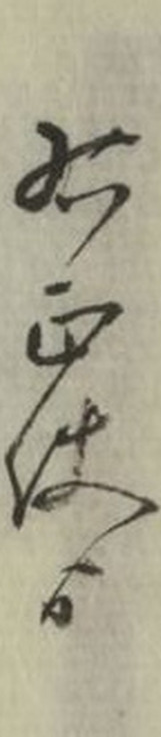右正使ゟ

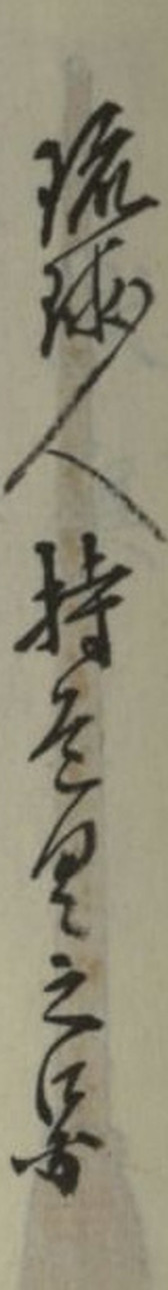琉球人持道具之図

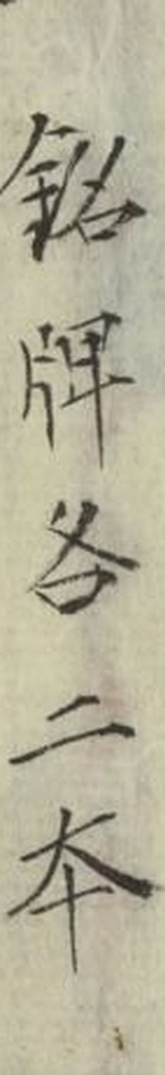銘牌各二本
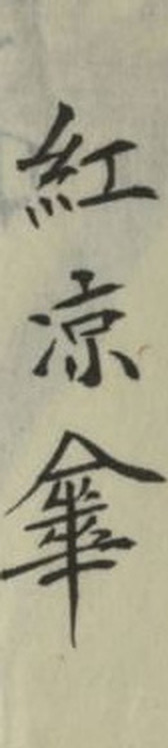紅涼傘

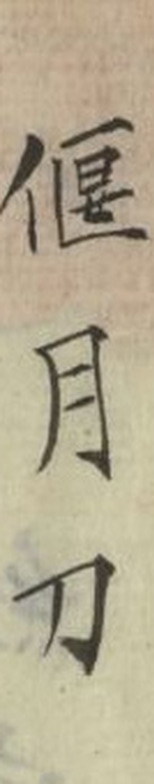偃月刀
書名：琉球人来朝記 三
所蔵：University of the Ryukyus Library
